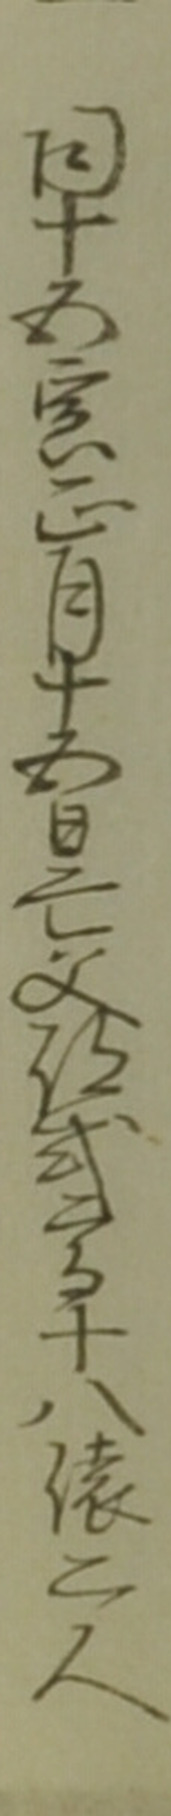一同十五寅正月十五日亡父跡式高十八俵二人

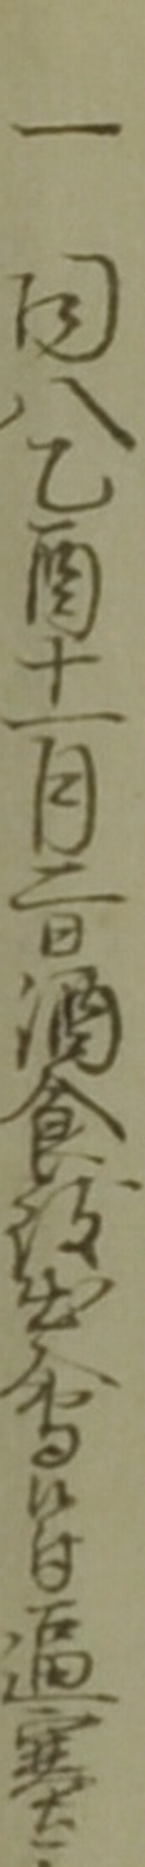一同八乙酉十一月二日酒食致出会候付逼塞被
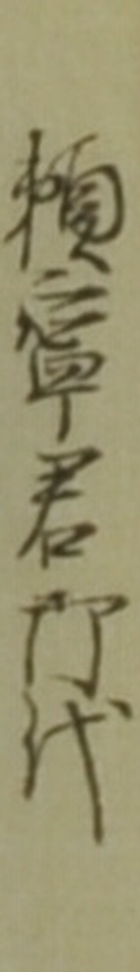頼寧君御代
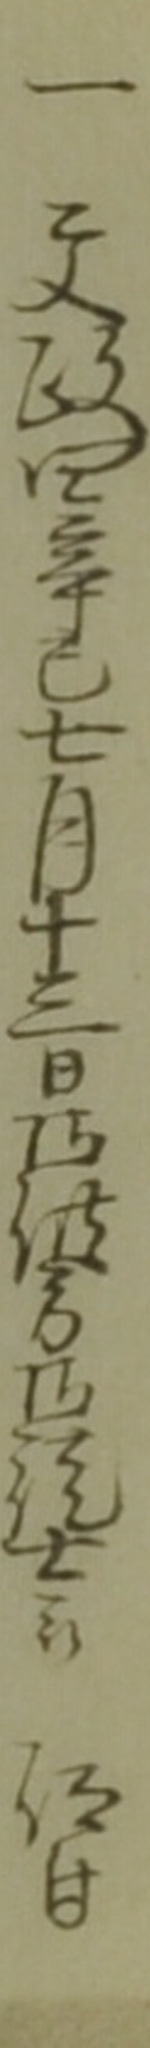一文政四辛巳七月十三日御供方御徒士被仰付
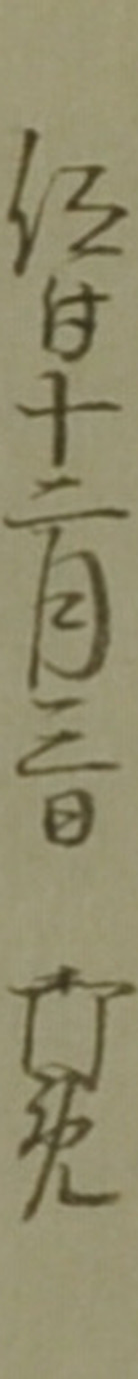仰付十二月三日御免
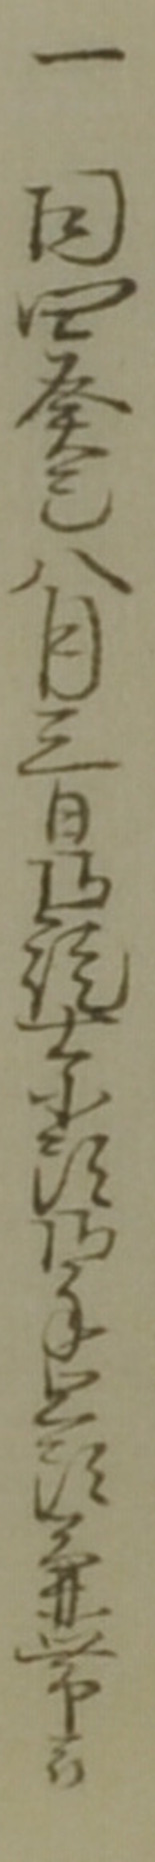一同四癸巳八月三日御徒士小頭御手廻頭兼帯被
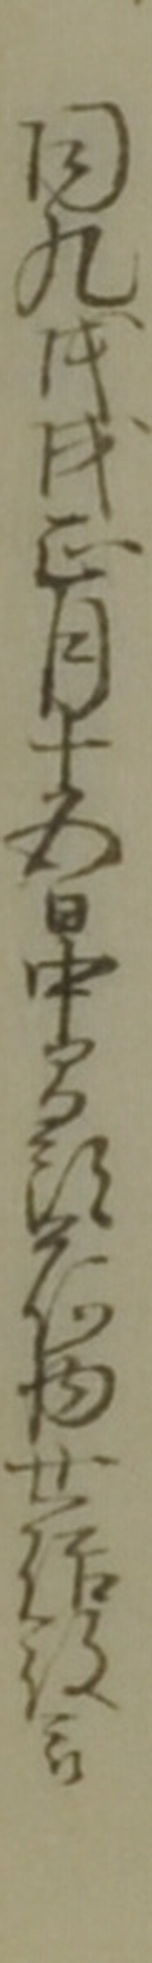一同九戊戌正月十五日中間頭荷物世話役被
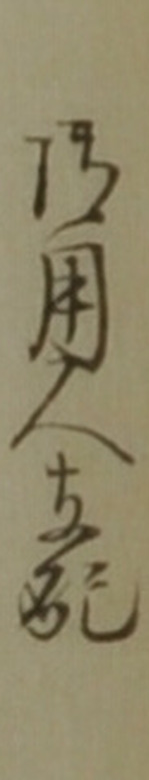御用人支配
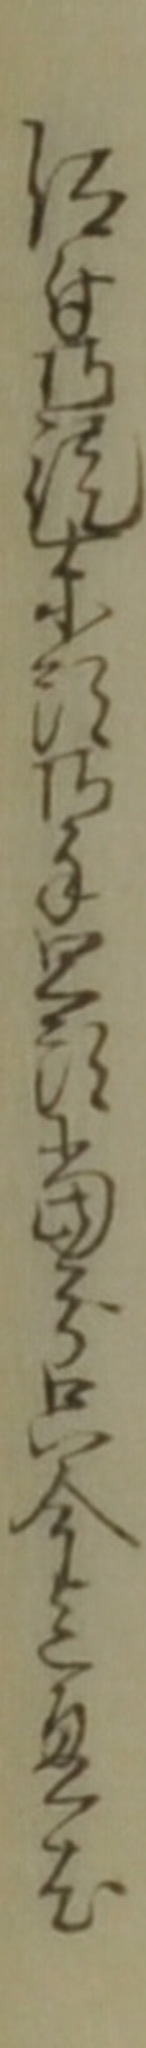仰付御徒士小頭御手廻頭当分只今迄通尤
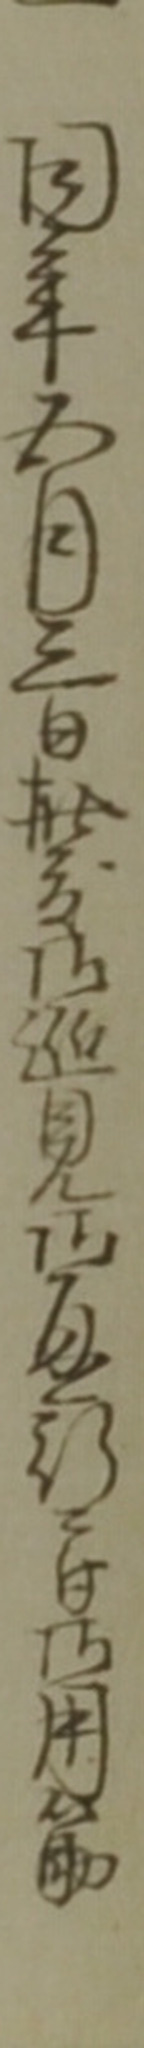一同年五月三日此度御巡見御通行ニ付御用筋
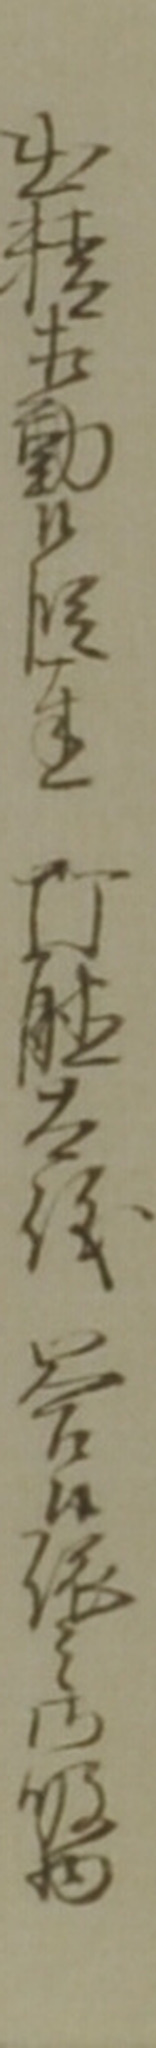出精相勤候段達御聴太儀思召候依之御吸物
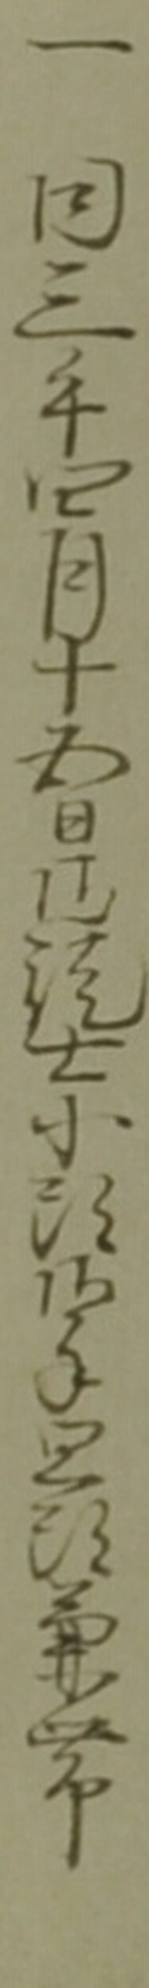一同三午四月十五日御徒士小頭御手廻頭兼帯

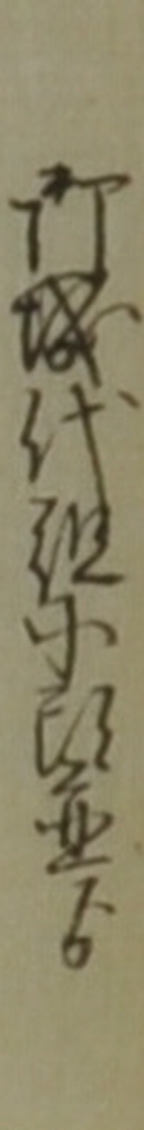御城代組小頭並ゟ
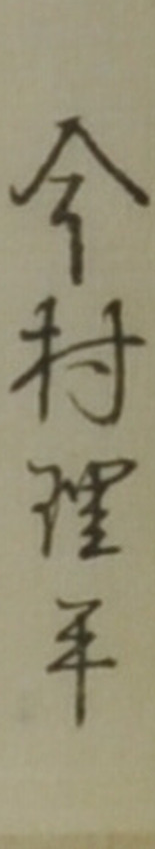今村理平
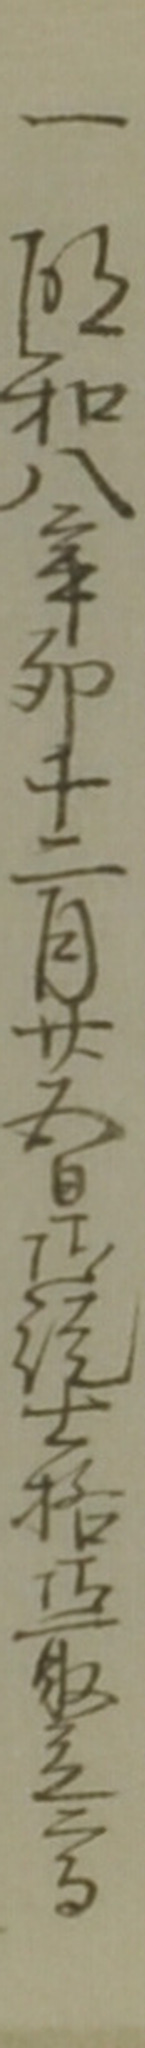一明和八辛卯十二月廿五日御徒士格御取立高
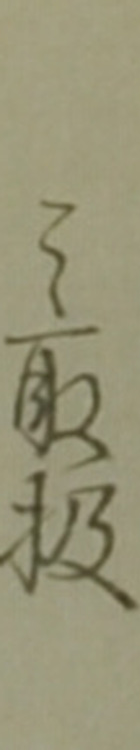之取扱
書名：無足諸士勤仕録（五）
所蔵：伊那市立高遠町図書館・合同会社AMANE
